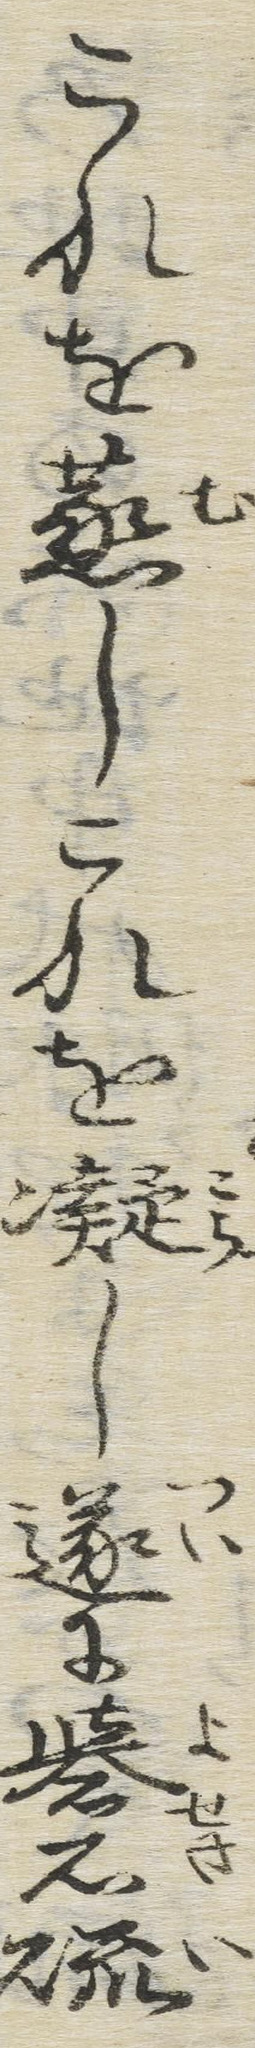これを蒸しこれを凝し遂に礜石硫
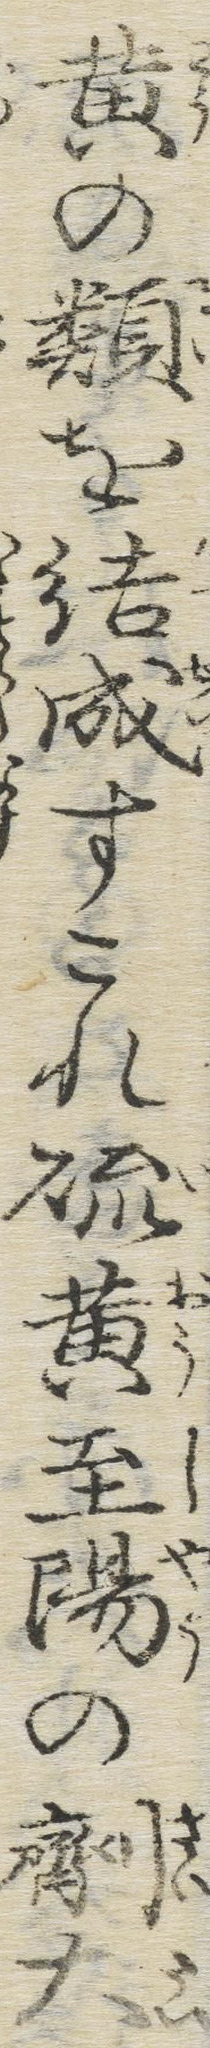黄の類を結成すこれ硫黄至陽の剤大
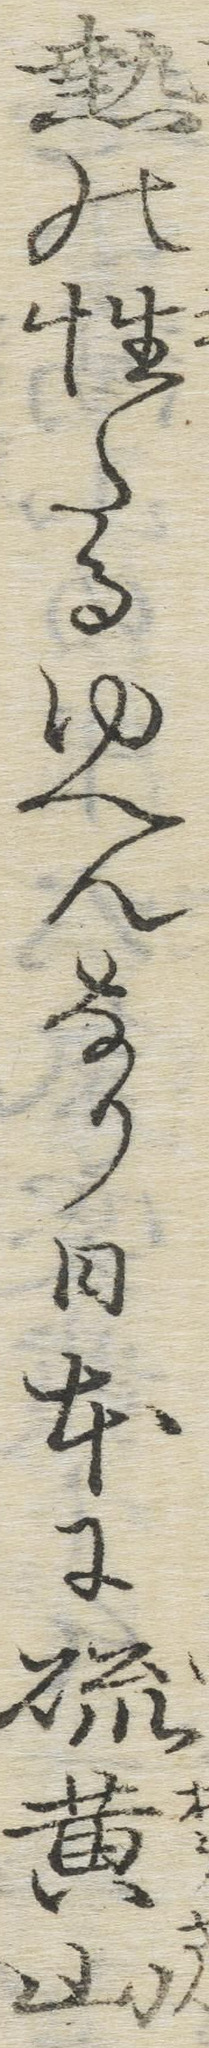熱の性たるゆへんなり日本に硫黄山
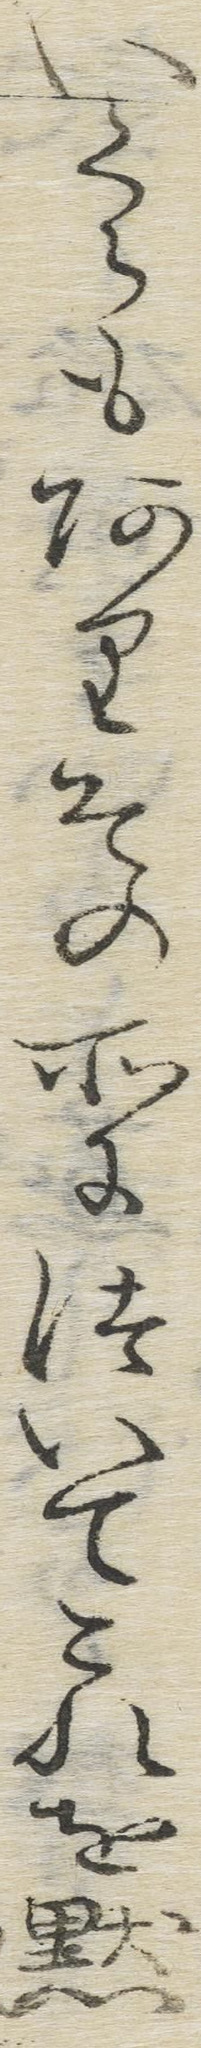いくらもありその所についてこれを黙
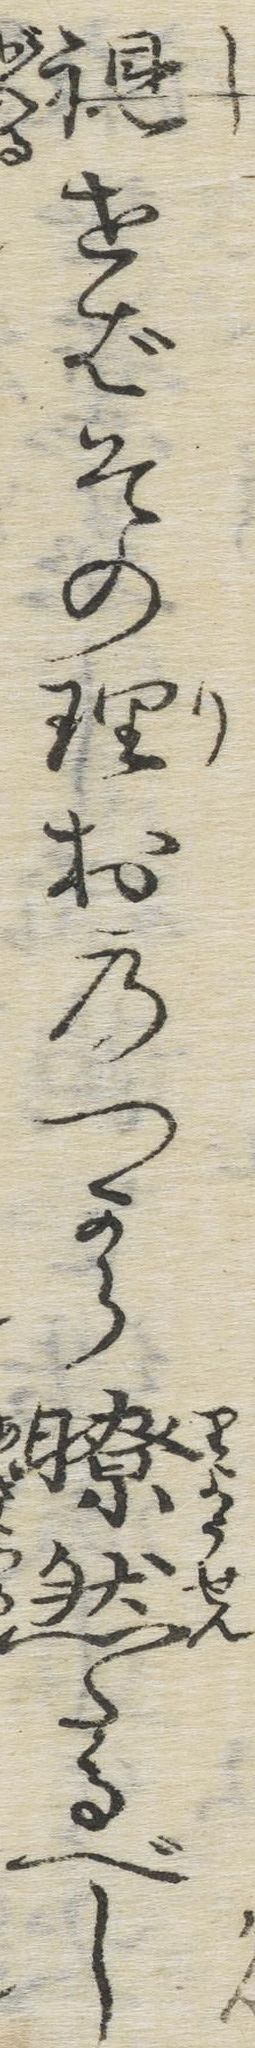視せばその理おのつから瞭然たるべし
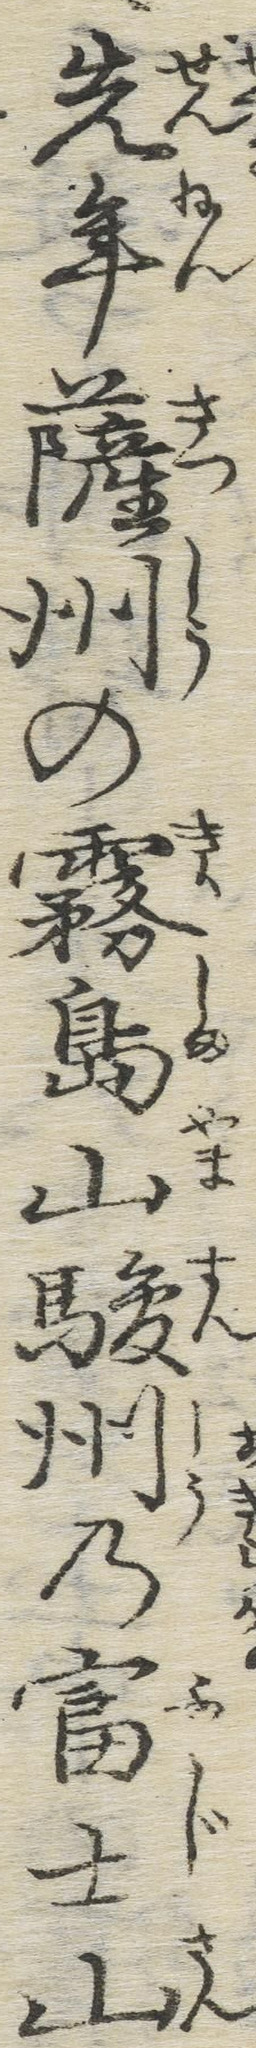先年薩州の霧島山駿州の富士山
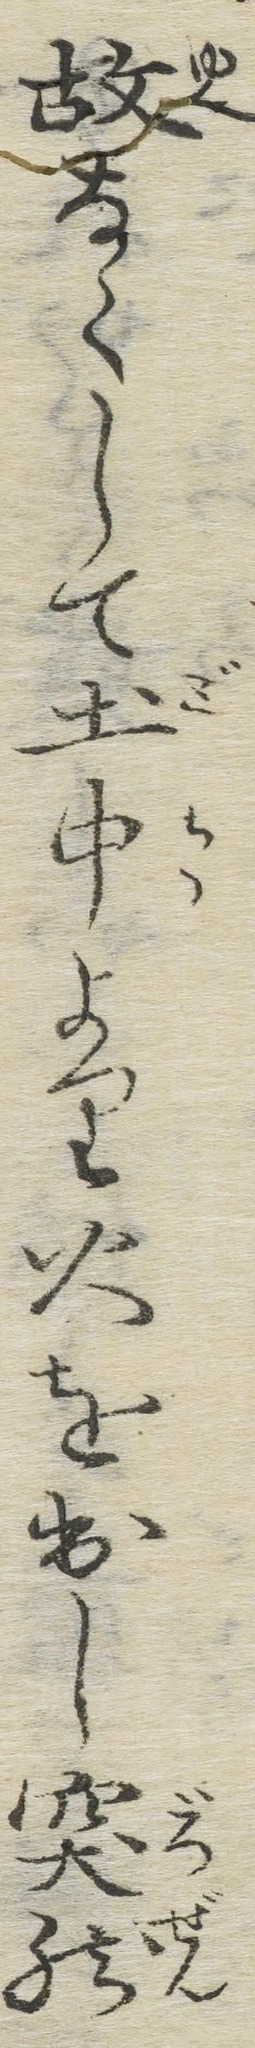故なくして土中より火を出し突然
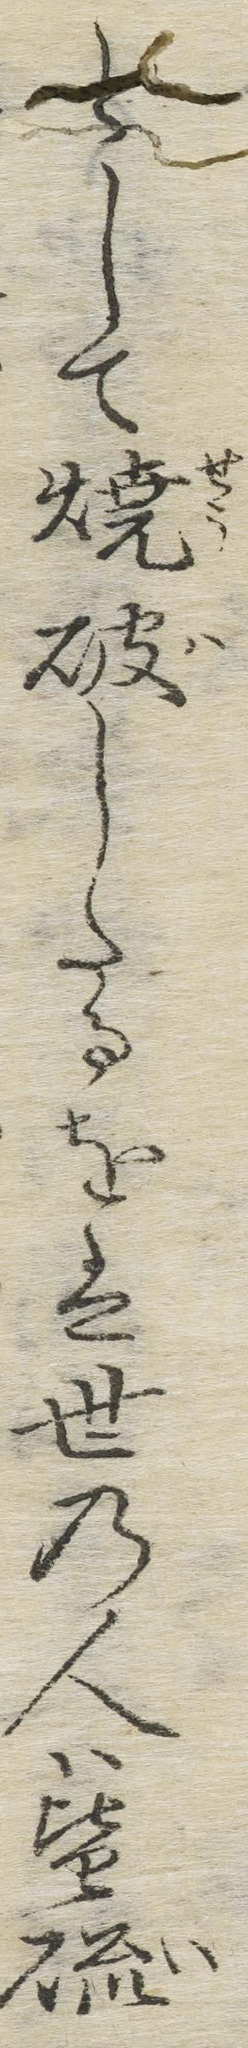として焼破したるをは世の人は皆硫
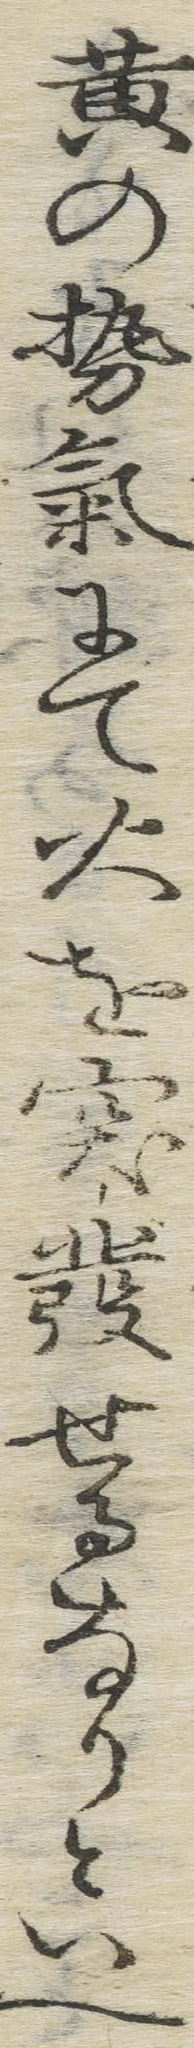黄の勢気にて火を突発せるなりといへ

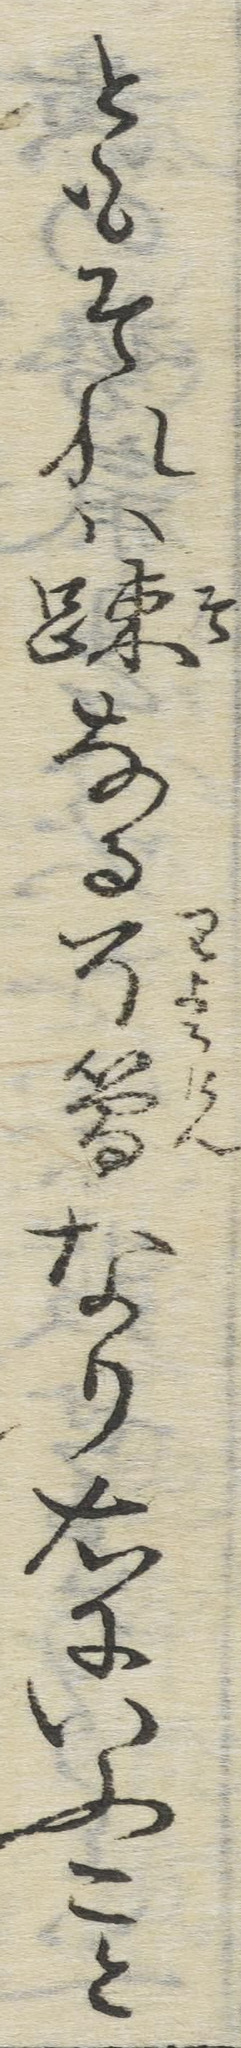ともそれは疎なる了簡なり右にいふこと
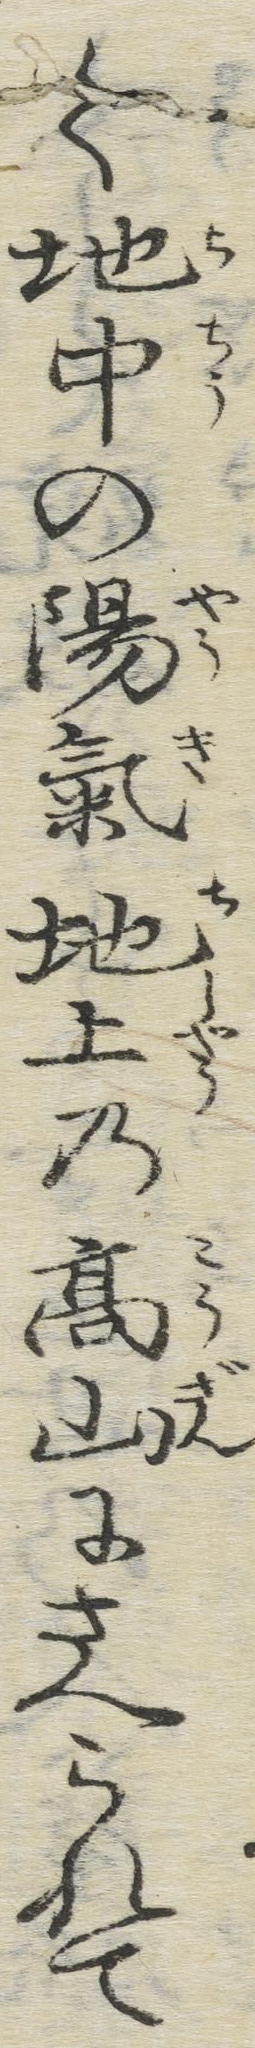く地中の陽気地上の高山にさへられて
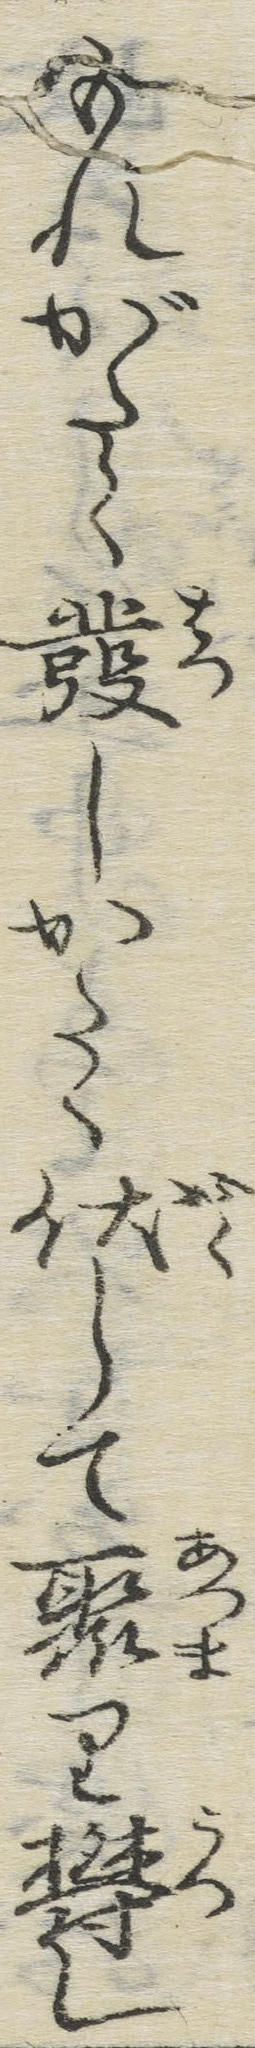もれがたく発しかたく伏して聚り欝し
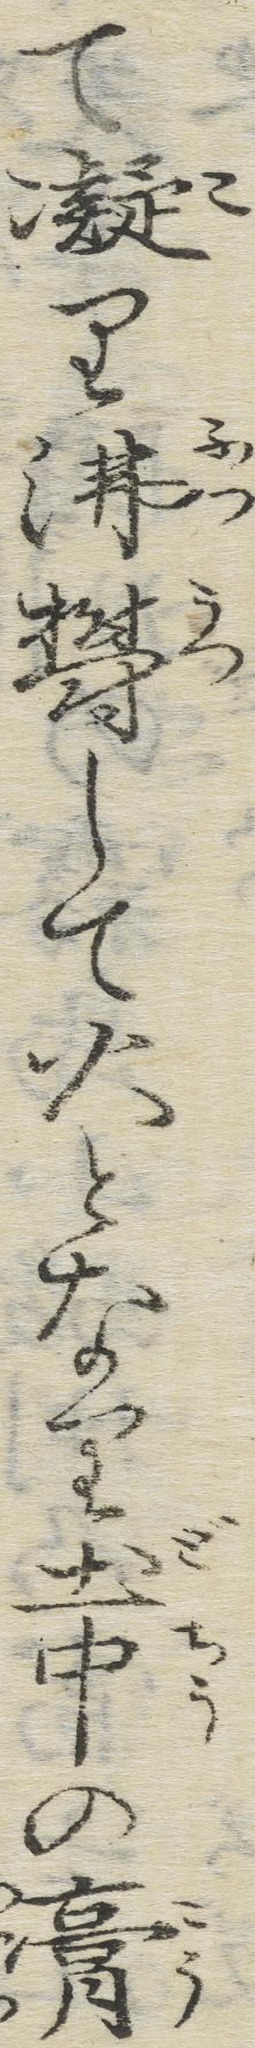て凝り沸欝して火となり土中の膏
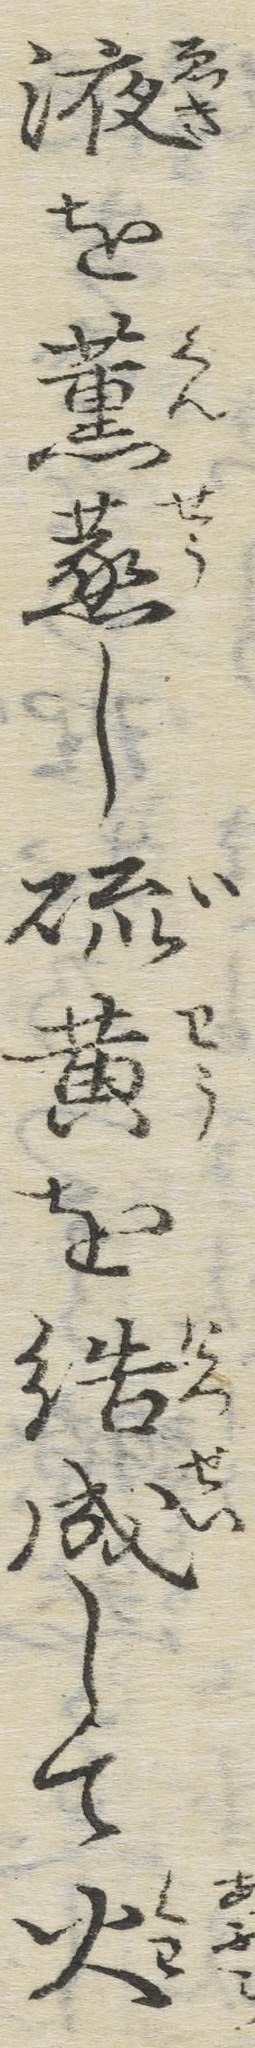液を薫蒸し硫黄を結成して火
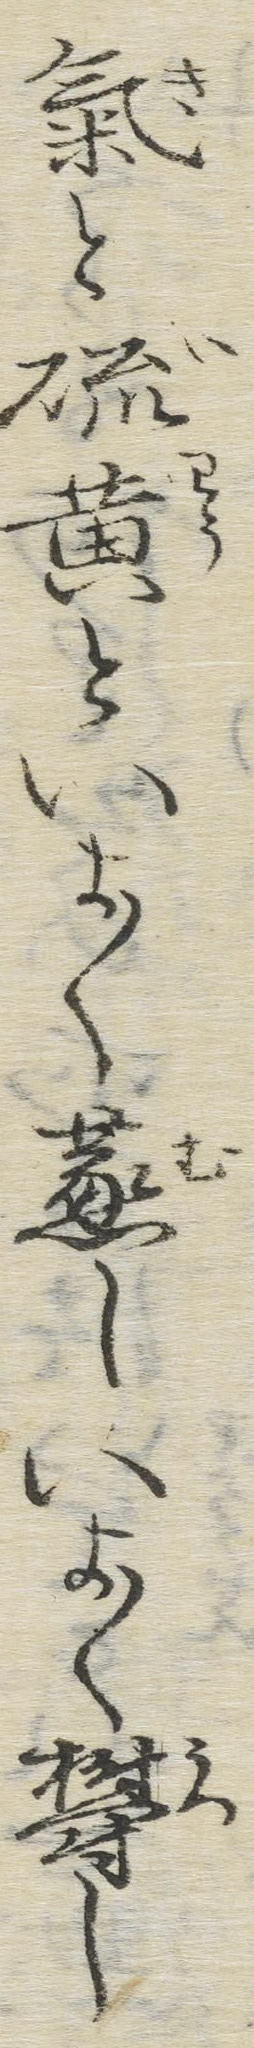気と硫黄といよ〳〵蒸しいよ〳〵欝し
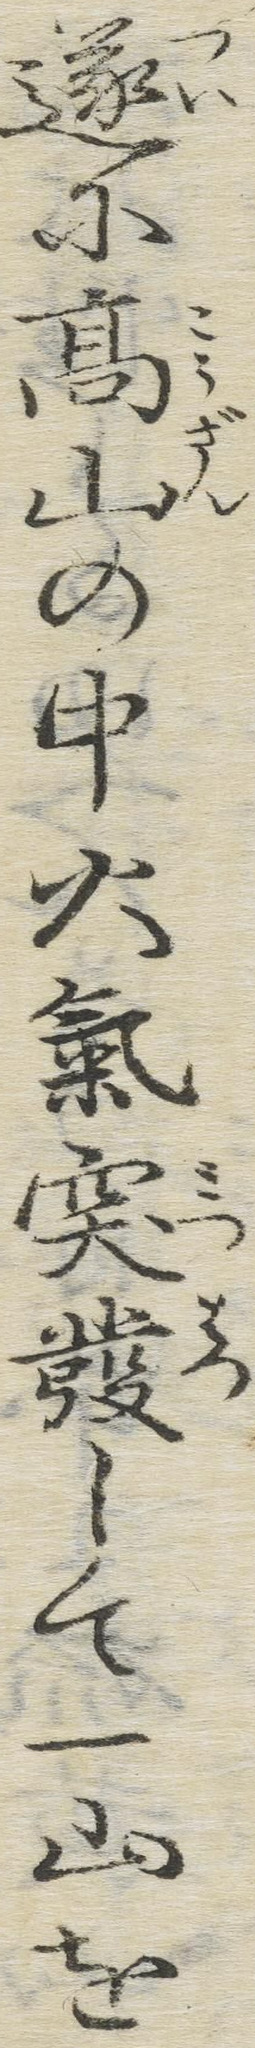遂に高山の中火気突発して山を
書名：温泉考
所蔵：東京大学地震研究所図書室 Earthquake Research Institute Library, The University of Tokyo, JAPAN
